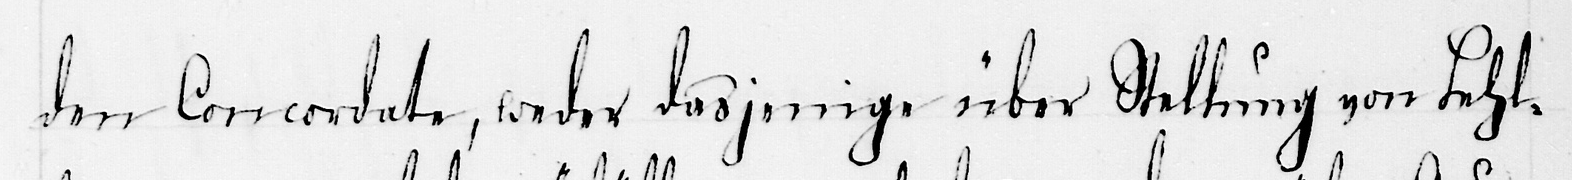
den Concordate, weder dasjenige über Stellung von Fehl¬
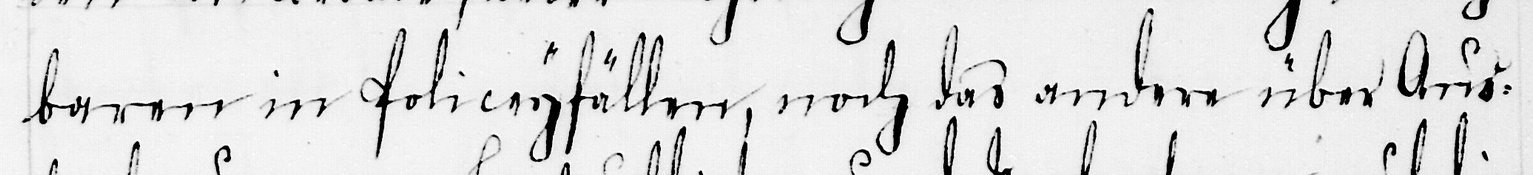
baren in Policeyfällen, noch das andere über Aus¬
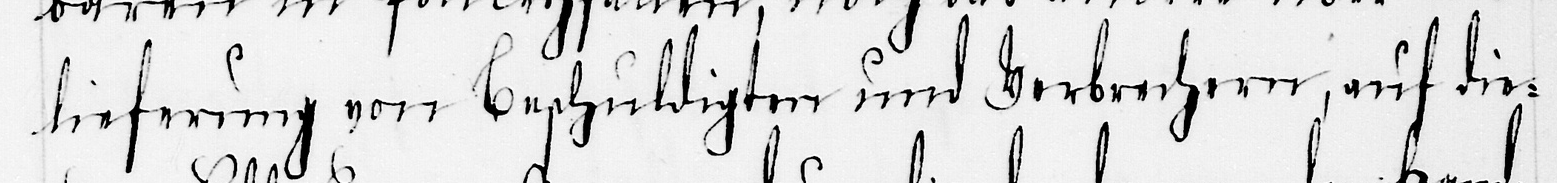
lieferung von Beschuldigten und Verbrechern, auf die¬
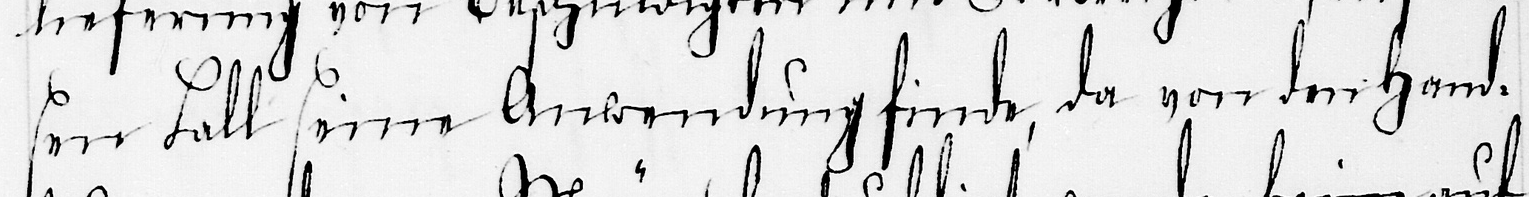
sen Fall seine Anwendung finde, da von den Hand¬
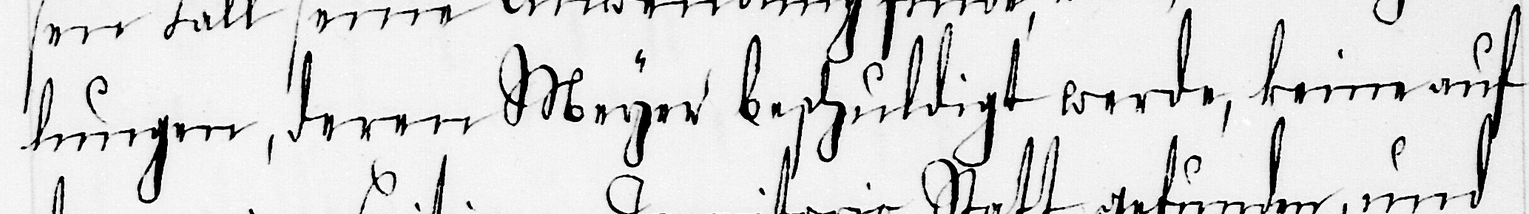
lungen, deren Meyer beschuldigt werde, keine auf
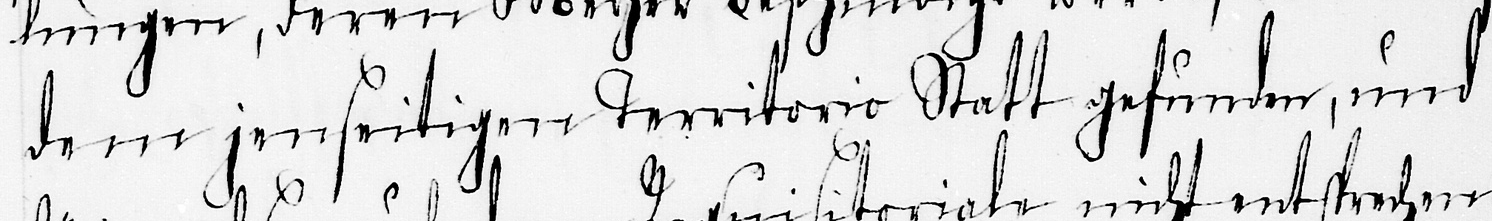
dem jenseitigen Territorio Statt gefunden, und
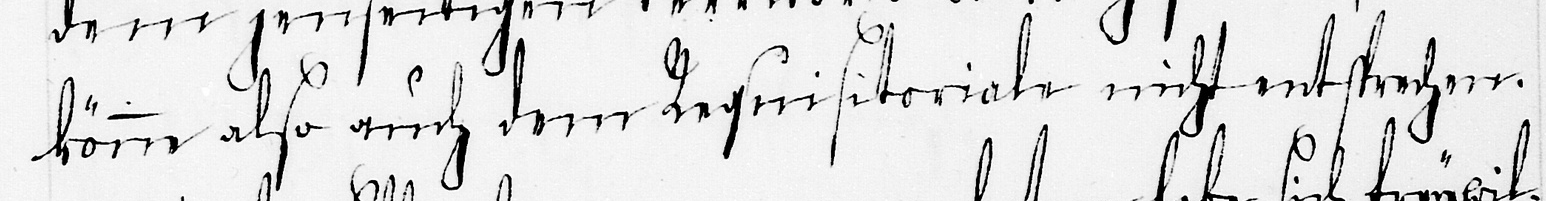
könne also auch dem Requisitoriale nicht entsprechen.
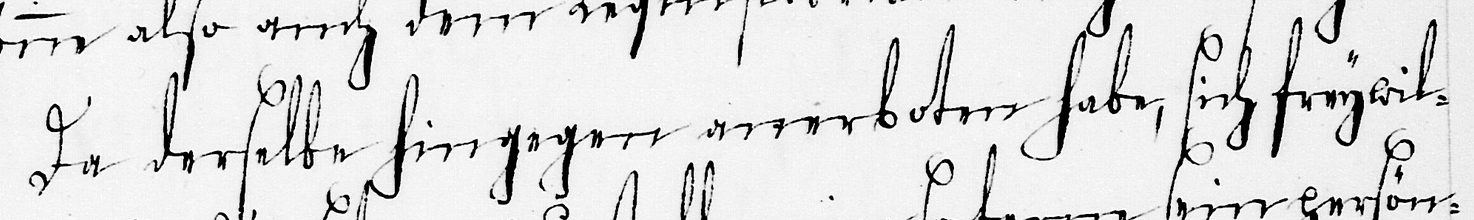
Da derselbe hingegen anerboten habe, sich freywil¬
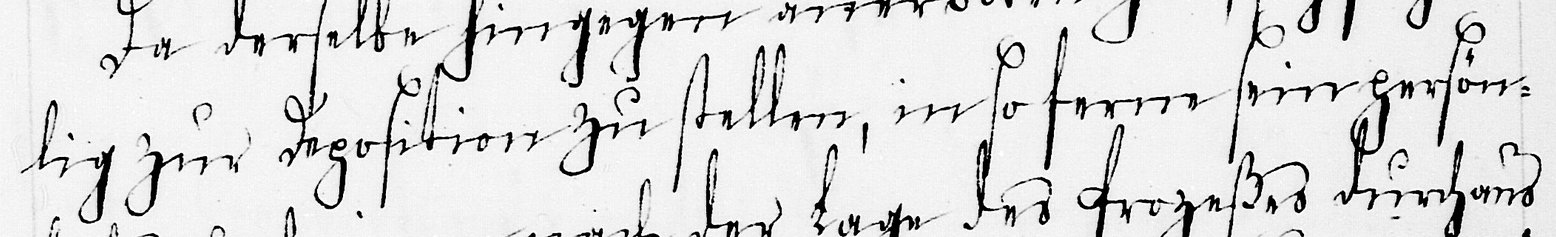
lig zur Deposition zu stellen, insoferne sein persön¬
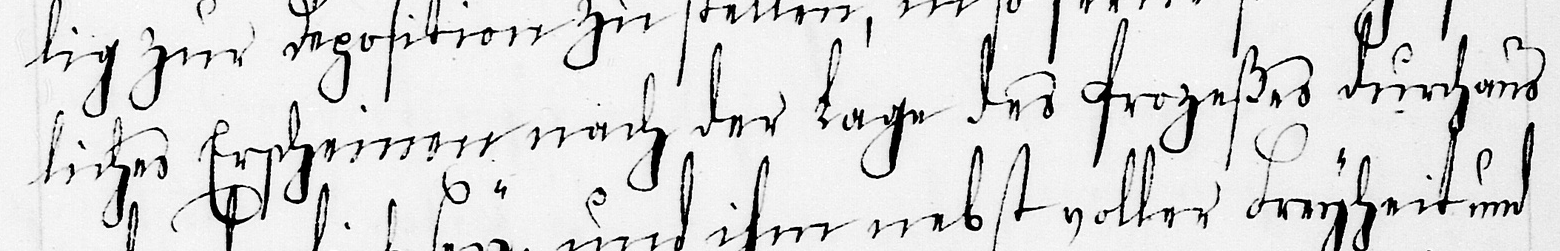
liches Erscheinen nach der Lage des Prozeßes durchaus
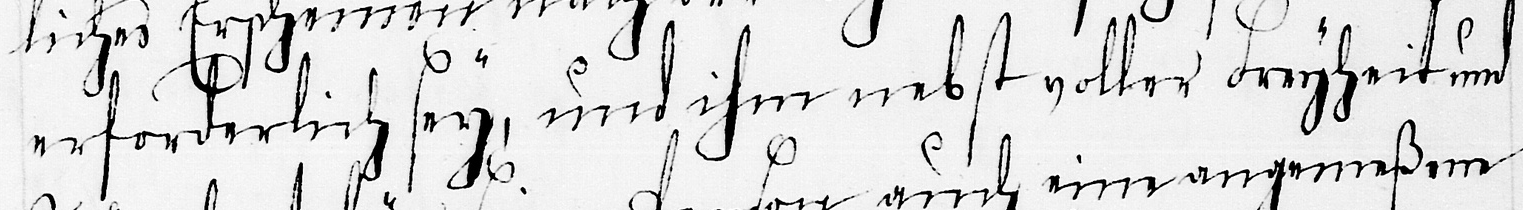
erforderlich sey, und ihm nebst voller Freyheit und
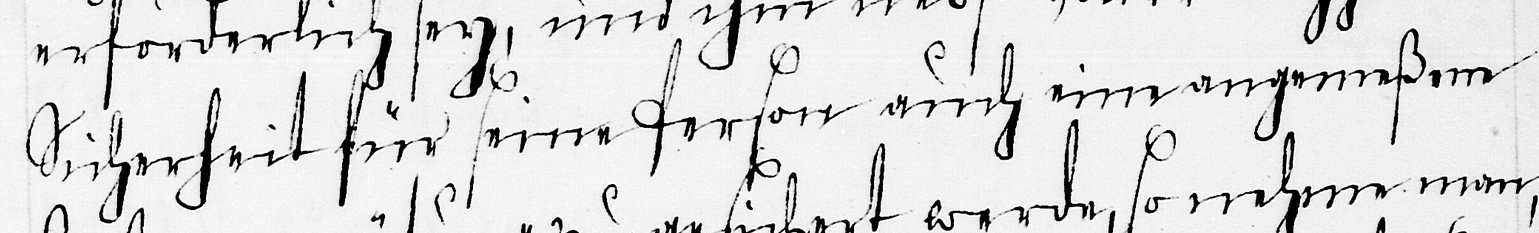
Sicherheit für seine Person auch eine angemeßene
